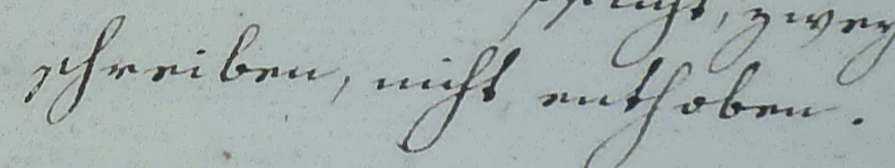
schreiben, nicht enthoben.
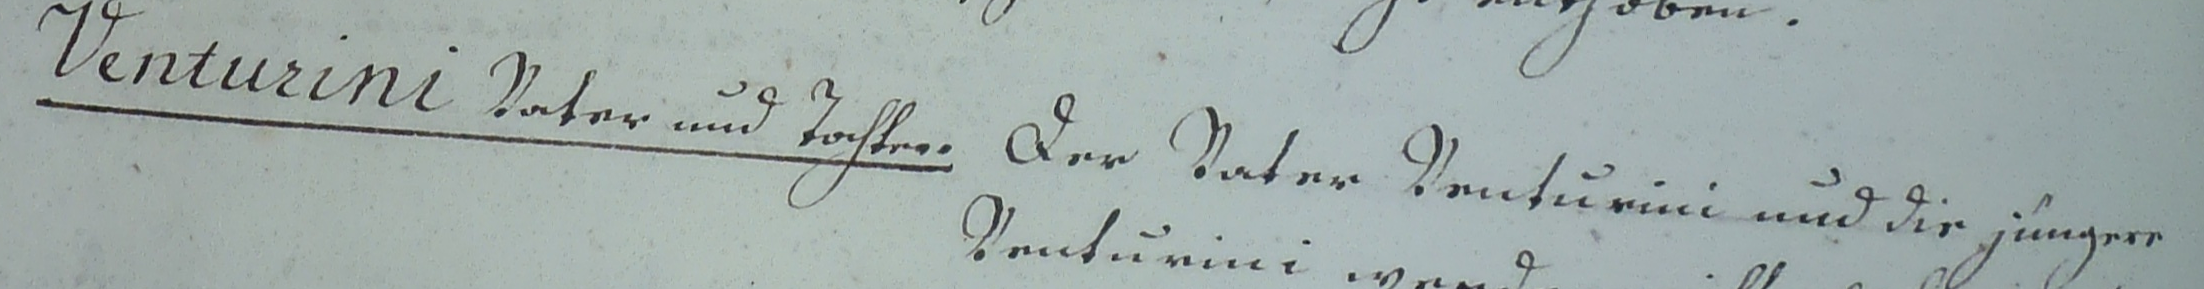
Venturini Vater und Tochter. Der Vater Venturini und die jüngere
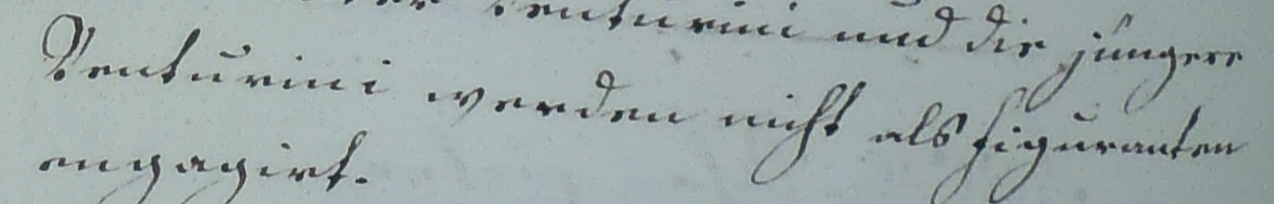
Venturini werden nicht als Figuranten
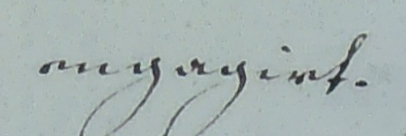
engagirt.
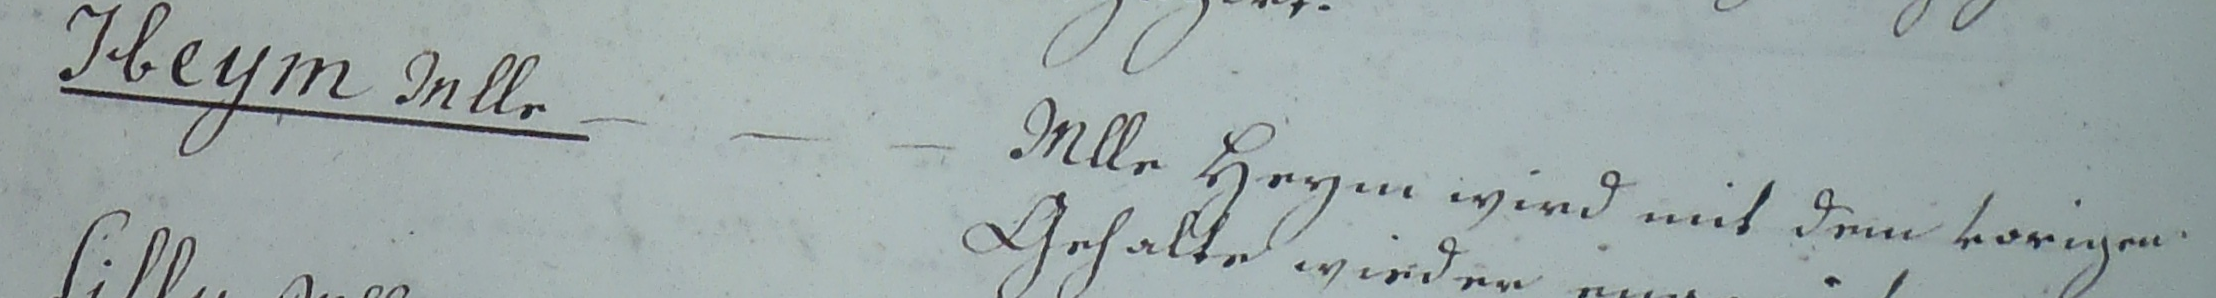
Heym Mlle _ _ _ Mlle Heym wird mit dem vorigen
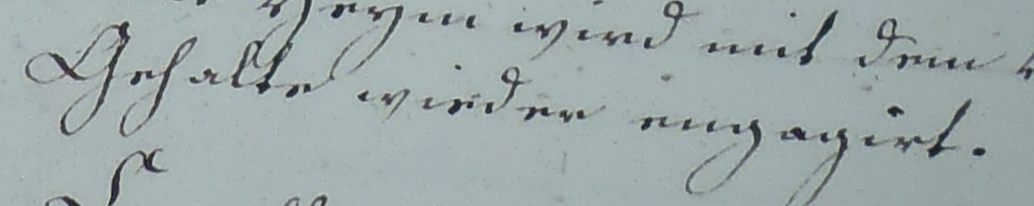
Gehalte wieder engagirt.
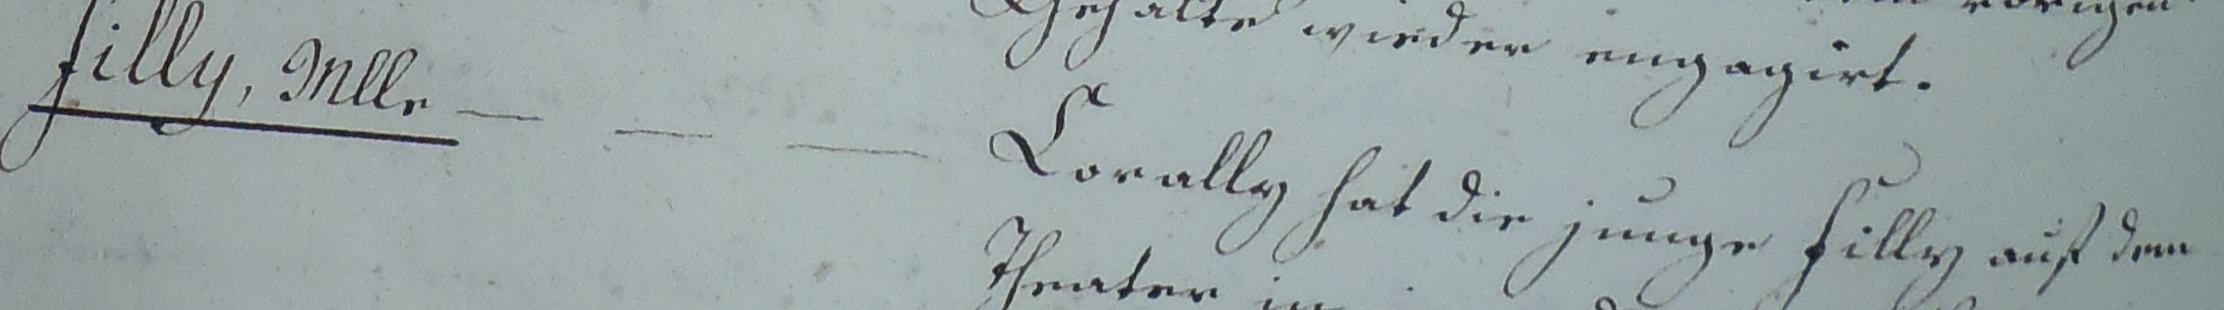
Filly, Mlle _ _ _ Corally hat die junge Filly auf dem
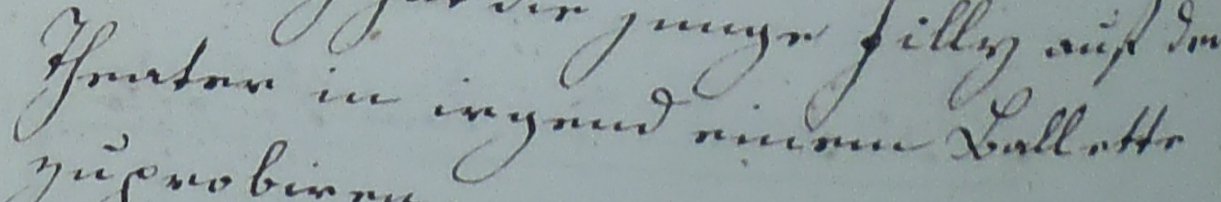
Theater in irgend einem Ballette
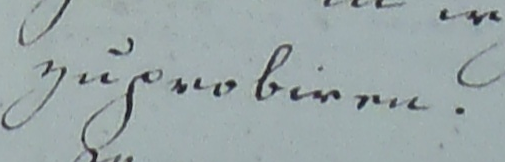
zuprobiren.
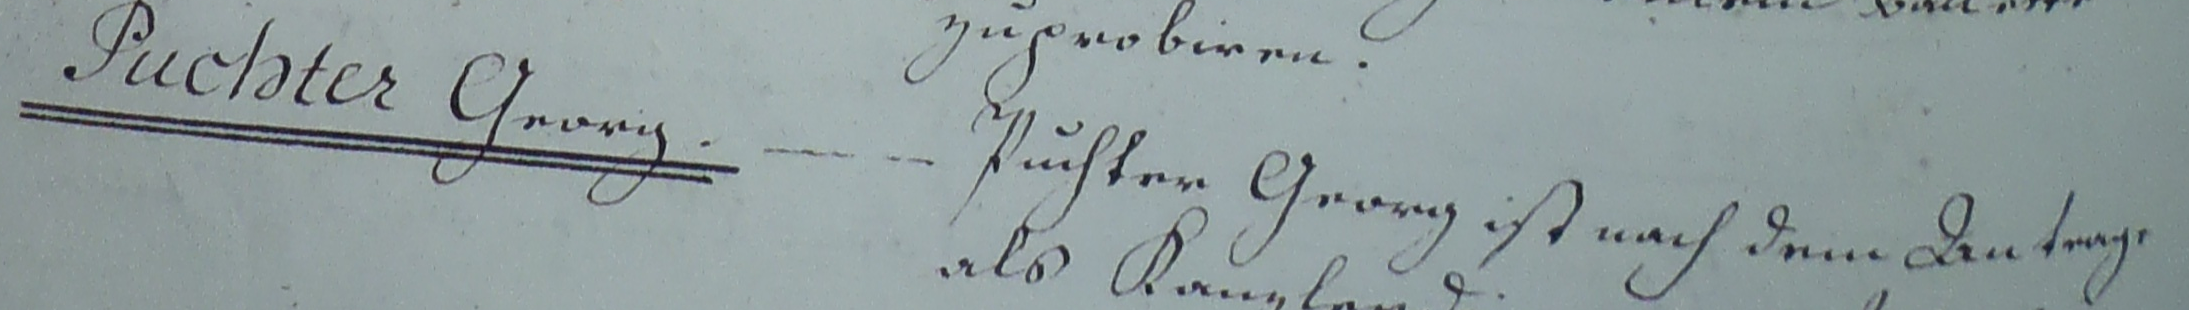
P̳u̳c̳h̳t̳e̳r̳ ̳G̳e̳o̳r̳g̳.̳ __ _ Puchter Georg ist nach dem Antrage
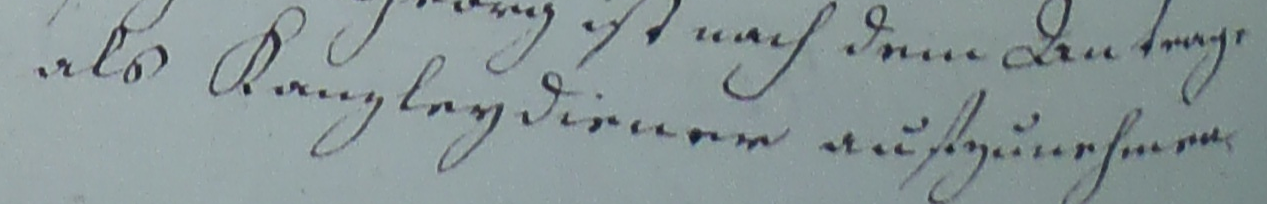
als Kanzleydiener aufzunehmen
